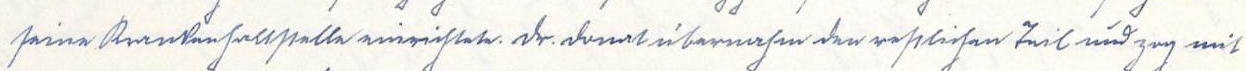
seine Krankenhaltstelle einrichtete. Dr. Donat übernahm den restlichen Teil und zog mit
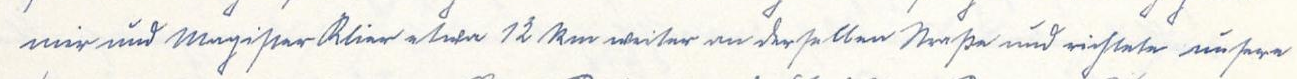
mir und Magister Klier etwa 12 km weiter an derselben Straße und richtete unsere
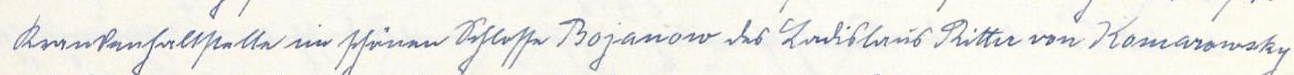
Krankenhaltstelle im schönen Schlosse Bojanow des Ladislaus Ritter von Komarowsky
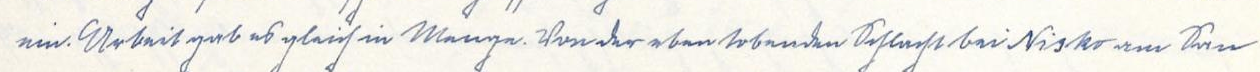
ein. Arbeit gab es gleich in Menge. Von der eben tobenden Schlacht bei Nisko am San
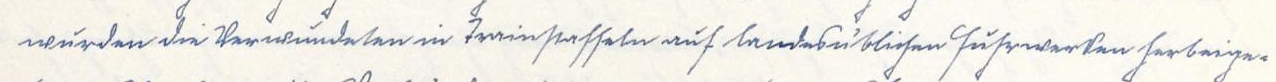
wurden die Verwundeten in Trainstaffeln auf landesüblichen Fuhrwerken herbeige-
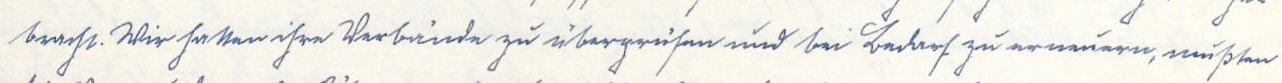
gebracht. Wir hatten ihre Verbände zu überprüfen und bei Bedarf zu erneuern, mußten
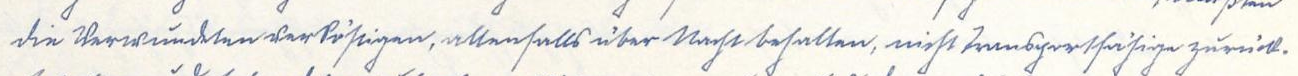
die Verwundeten verköstigen, allenfalls über Nacht behalten, nicht Transportfähige zurück
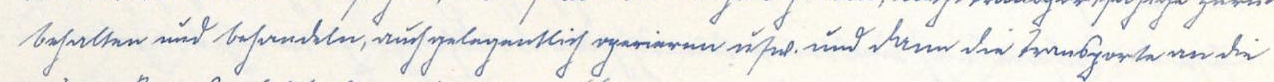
behalten und behandeln, auch gelegentlich operierten usw. und dann die Transporte an die
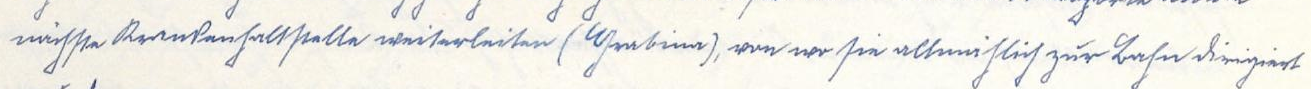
nächste Krankenhaltstelle weiterleiten (Grabina) von wo sie allmählich zur Bahn dirigiert
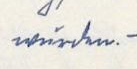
wurden.
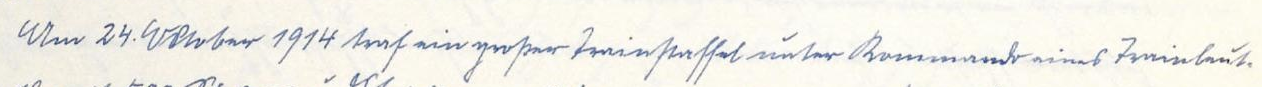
Am 24. Oktober 1914 traf ein großer Trainstaffel unter Kommando eines Trainleut-
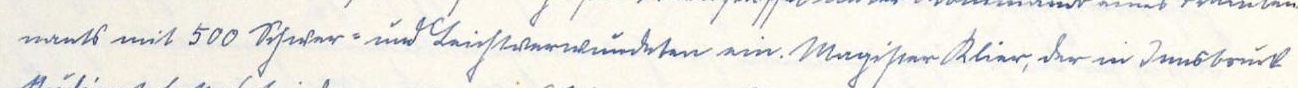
nants mit 500 Schwer- und Leichtverwundeten ein. Magister Klier, der in Innsbruck
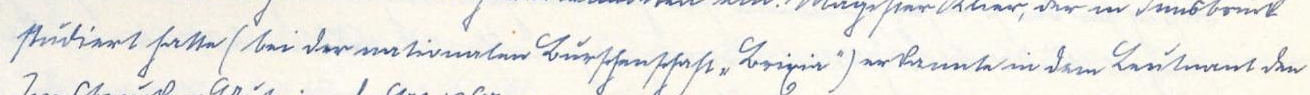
studiert hatte (bei der nationalen Burschenschaft „Brixia“) erkannte in dem Leutnant
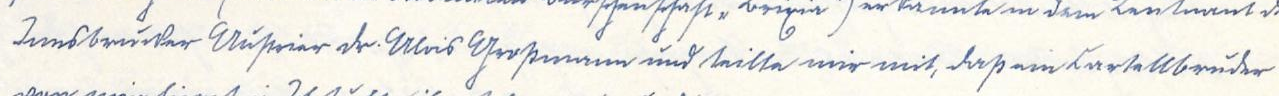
den Innsbrucker Austrier Dr. Alois Großmann und teilte mir mit, dass ein Cartellbruder
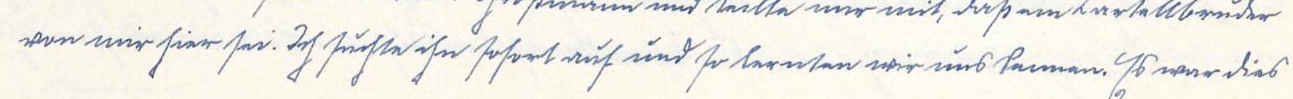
von mir hier sei. Ich suchte ihn sofort auf und so lernten wir uns kennen. Es war dies
